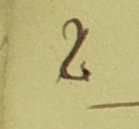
2
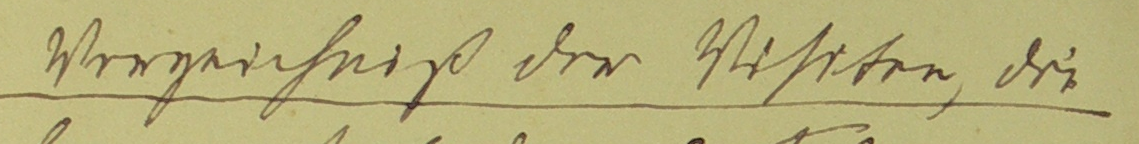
Verzeichniß der Visiten, die
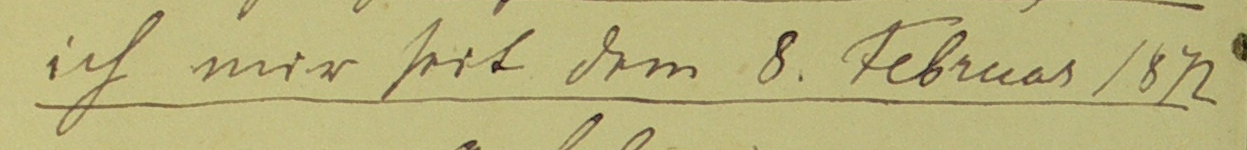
ich mir seit dem 8. Februar 1872
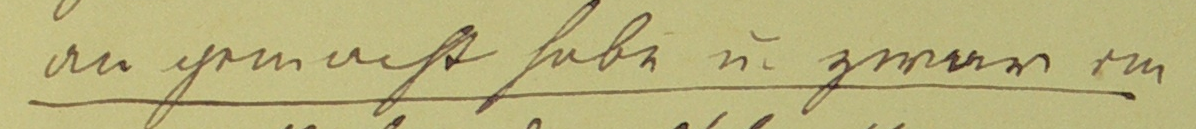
an gemacht habe und zwar von
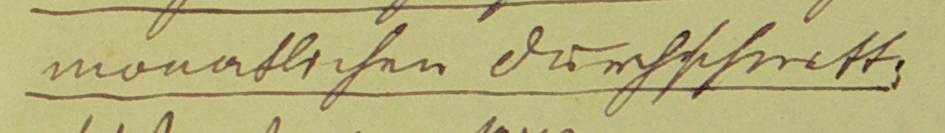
monatlichem Durchschnitt:
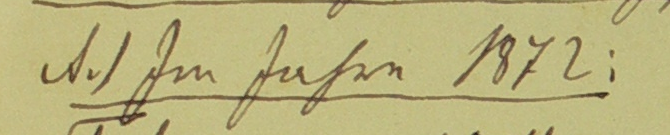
A.) Im Jahr 1872:
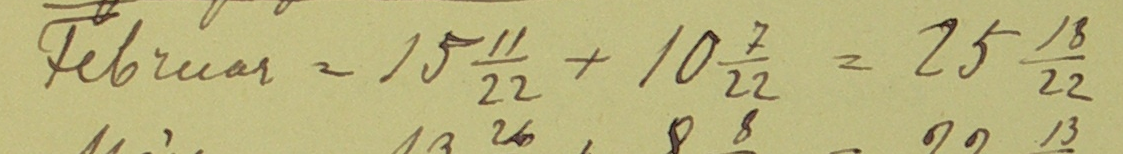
Februar = 15 11/22 + 10 7/22 = 25 18/22
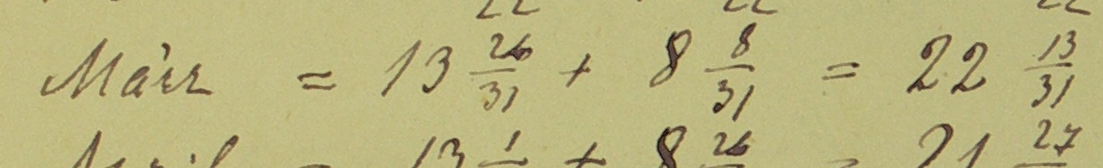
März = 13 26/31 + 8 8/31 = 22 22/31
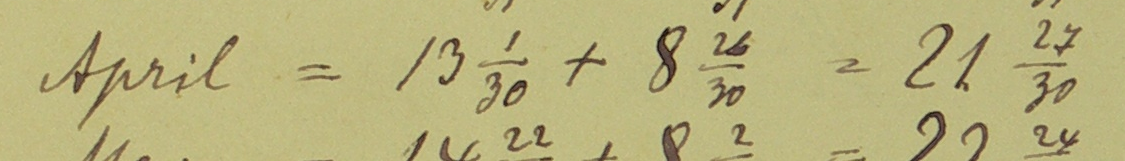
April = 13 1/30 + 8 26/30 = 21 27/30
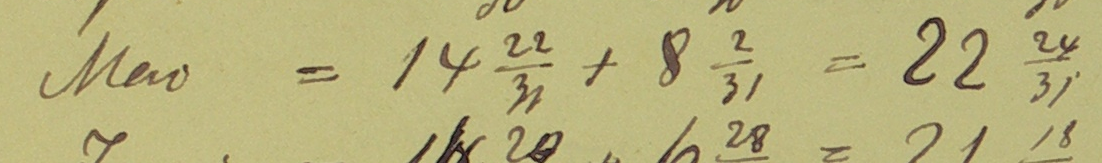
Mai = 14 22/31 + 8 2/31 = 22 24/31
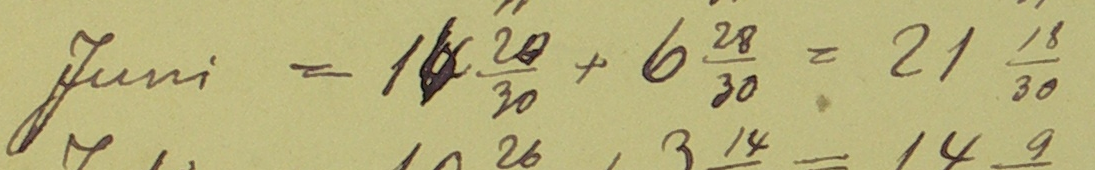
Juni = 14 20/30 + 6 28/30 = 21 18/30
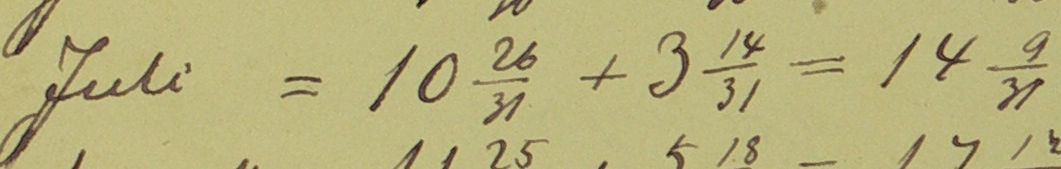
Juli = 10 26/31 + 3 14/31 = 14 9/31
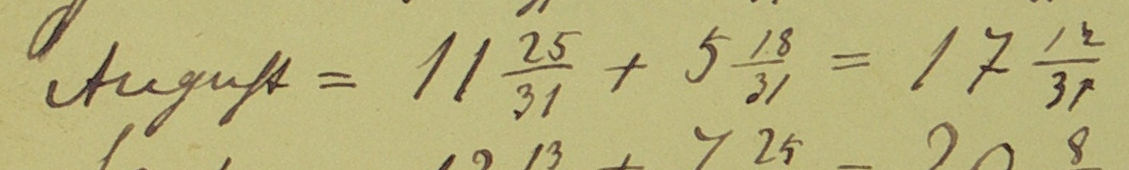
August = 11 25/31 + 5 18/31 = 17 12/31
